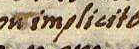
ou implicito
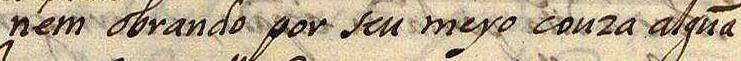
nem obrando por seu meyo couza algūa.
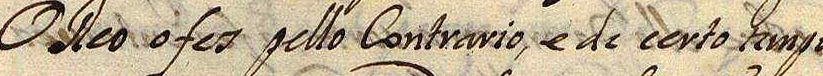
O Reo o fes pello Contrario, e de certo tempo
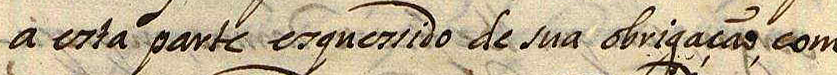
a esta parte esquessido de sua obrigação, com
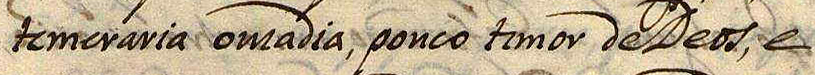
temeraria ousadia, pouco temor de Deos, e
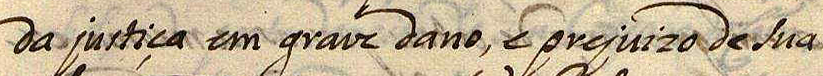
da justiça em grave dano, e prejuizo de sua
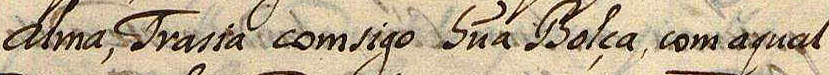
alma, Trasia comsigo hūa Bolça, com a qual
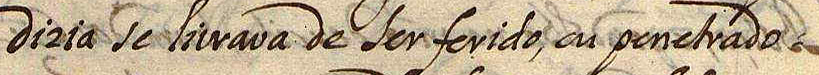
dizia se livrava de ser ferido, ou penetrado
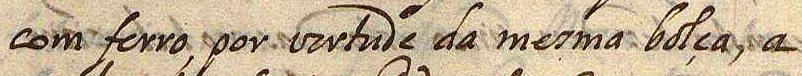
com ferro, por virtude da mesma bolça, a
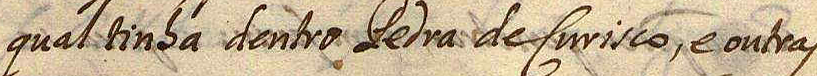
qual tinha dentro Pedra de Curisco, e outras
